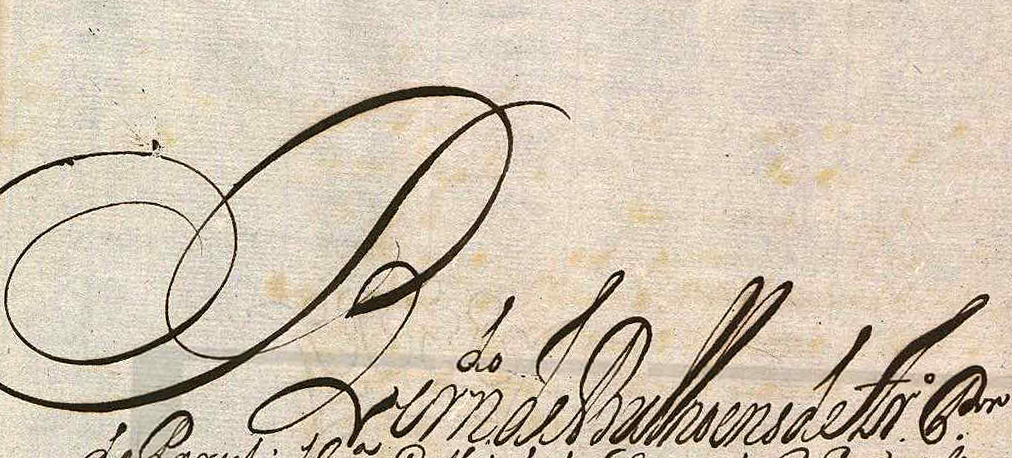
Brern.do de Bulhoens de Ar.o P.or
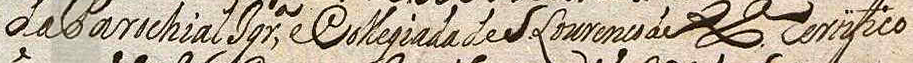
da Parochial Igr,a e Collegiada de S. Lourenço de Lx.a certifico
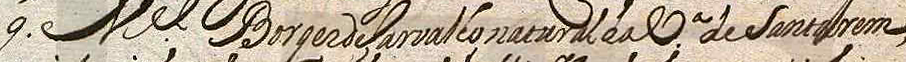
q̄ M.el Borges de Carvalho, natural da V.a de Santarem,
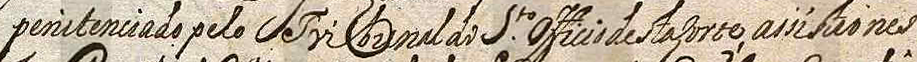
penitenciado pelo Tribunal do S.to Officio desta Corte, assistio nes
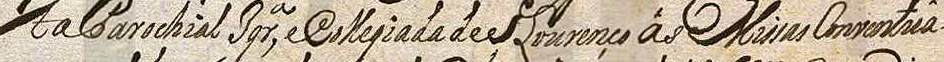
ta Parochial Igr,a Collegiada de S Lourenço ás Missas Conventuâ
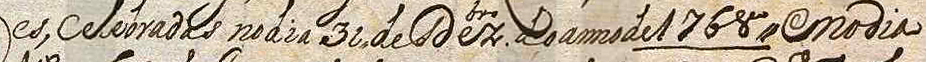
es, Celebradas no dia 31 de Dez.bro do anno de 1768// e no dia
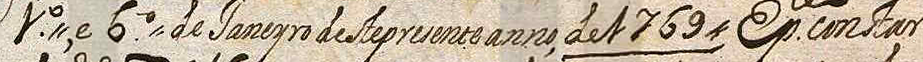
1.o//, e 6.o// de Ianeyro deste presente anno, de 1769// E p.a constar
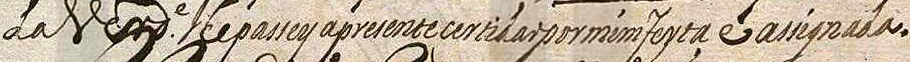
da Verd.e lhe passey a presente certidao por mim Feyta, e assignada.
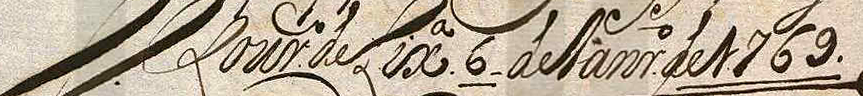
S. Lour.co de Lix.a 6 de Janr.o de 1769.
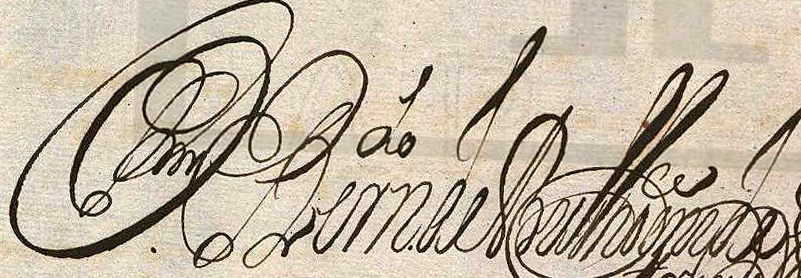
O Brern.do de Bulhoens de
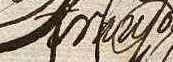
Araujo
